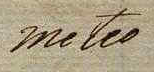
meteo
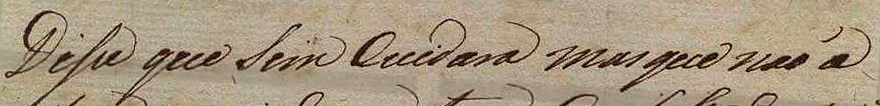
Disse que sim cuidara, mas que naõ a
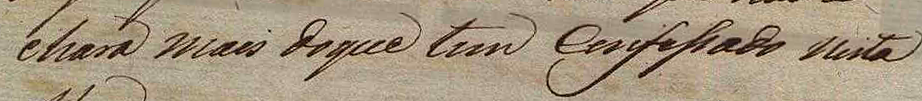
chara mais do que tem confessado nesta
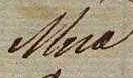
Meza
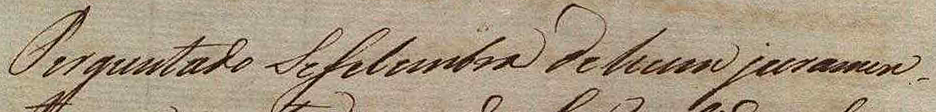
Perguntado Se se lembra de hum juramen
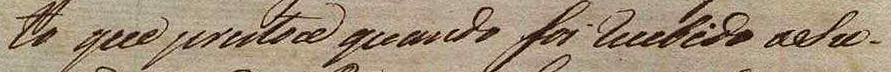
to que prestou quando foi Recebido a Su
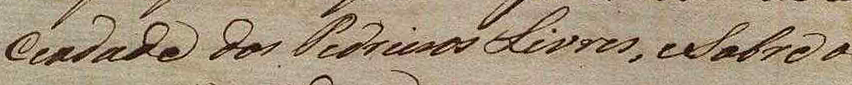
ceadade dos Pedreiros Livres, e Sobre o
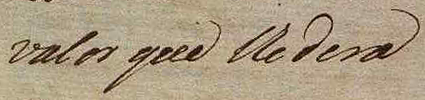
valor que lhe dera
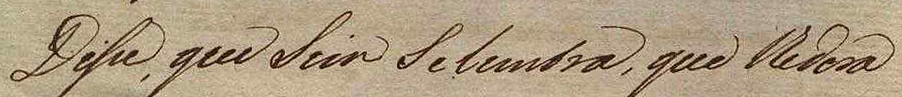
Disse, que Sim Se lembra, que lhe dera
